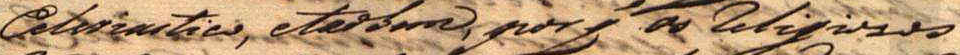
Ecleziastico, e taõbem, por q̄ os Religiozos
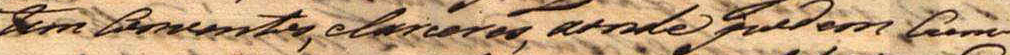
tem Conventos, e Carceres, aonde podem Cum
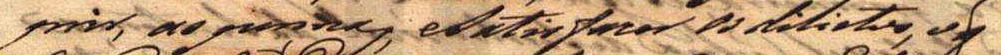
prir, as pennas, e Satisfazer os dilictos, o q̄
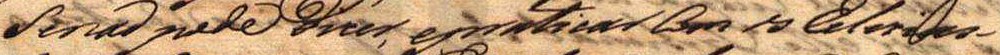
Se naõ pode dizer, e praticar Com os Eclesias
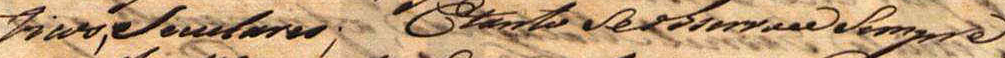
ticos, Seculares; E tanto se observou Sempre
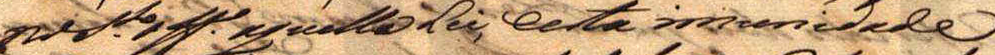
no S.to off.o aquella Lei, e esta imunidade,
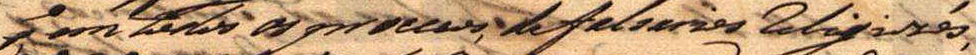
q̄ em todos os procesos, de falsarios Religiozos,
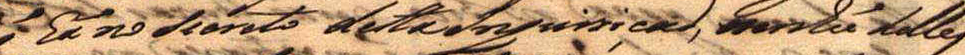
q̄ há no secreto desta Inquiziçaõ, nenhū delles
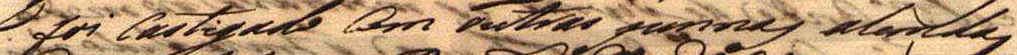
foi Castigado com outras pennas alem das
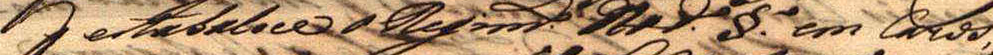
q̄ estabelece o Regim.to no d.o §.o em Cazos,
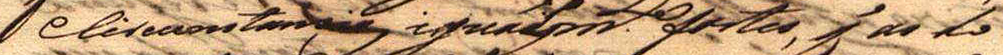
e Circunstancias igualm.te fortes, q̄ as do
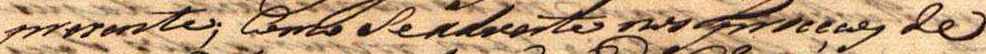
prezente; Como se adverte nos proceços de
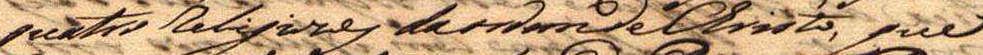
quatro Religiozos da ordem de Christo, que
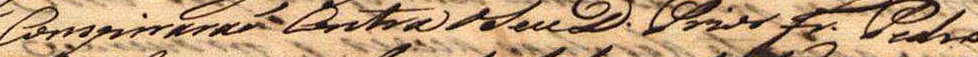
Conspiraraõ Contra o seu D. Prior Fr. Pedro
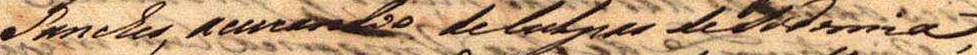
Sanches, acuzandoo de Culpas de Sodomia,
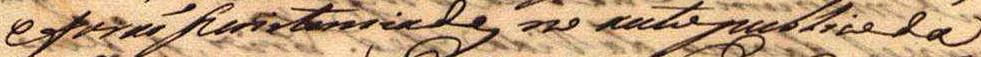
e foraõ penitensiados no auto publico da
